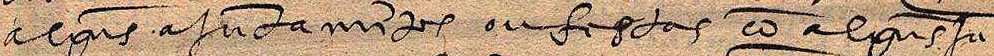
algūs aJūtamētos ou festas c̄o algūs Ju
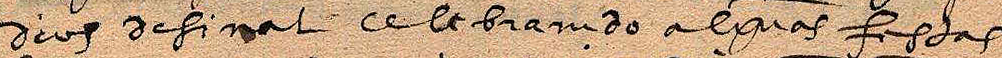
deos de sinal celebramdo alḡuas festas
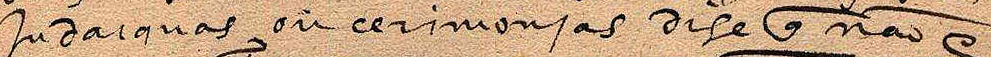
Judaiquas ou cerimonjas dise q̄ não e
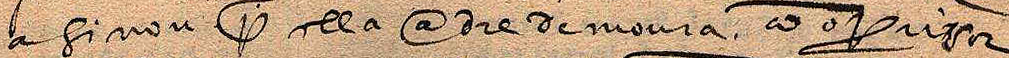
asinou p̄o ella ādre de moura c̄o o ꝓuisor
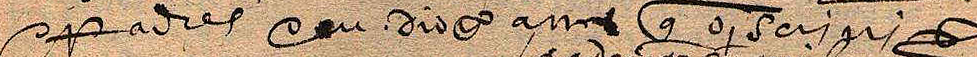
e padres e eu diogo aires q̄ o scriui
